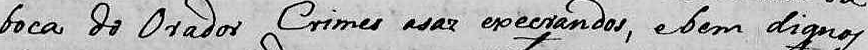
boca do Orador Crimes asaz execrandos, e bem dignos
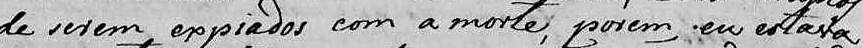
de serem expiados com a morte, porem eu estava
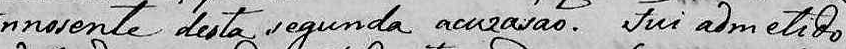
innosente desta segunda acuzaçaõ. Fui admetido
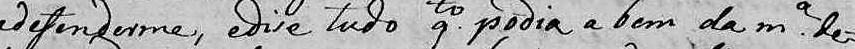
a defenderme, e dise tudo q.to podia a bem da m.a de
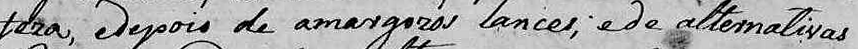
feza, e depois de amargozos lances, e de alternativas
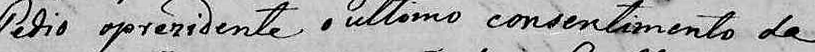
Pedio o prezidente o ultimo consentimento da
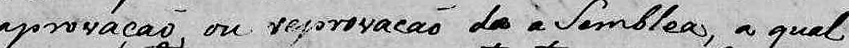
aprovaçaõ, ou reprovaçaõ da a Semblea, a qual
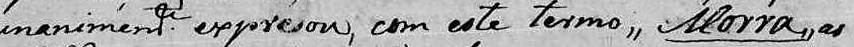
unanimem.te expresou, com este termo "Morra" as
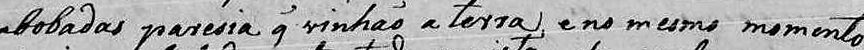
abobadas paresia q̄ vinhaõ a terra, e no mesmo momento
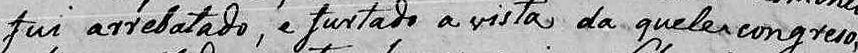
fui arrebatado, e furtado a vista daquele congreso,
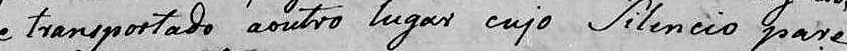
e transportado a outro lugar cujo Silencio pare
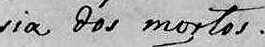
cia dos mortos.
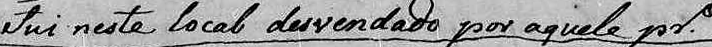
Fui neste local desvendado por aquele pr.o
